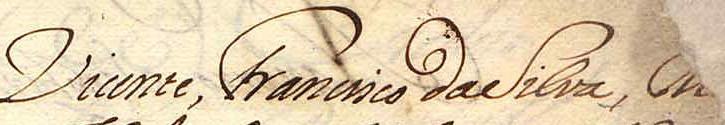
Vicente, Francisco da Silva, M_
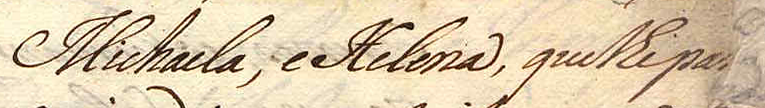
Michaela, e Helena, que lhe pa
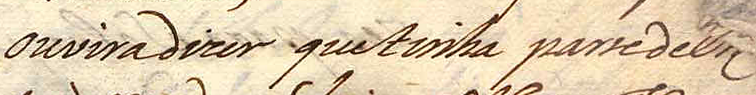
ouvira dizer que tinha parte de
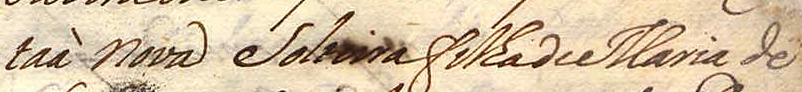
taã nova Solteira filha de Maria de
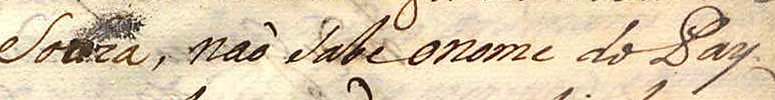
Souza, não sabe o nome do Pay
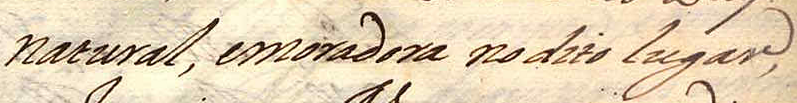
natural, e moradora no dito lugar,
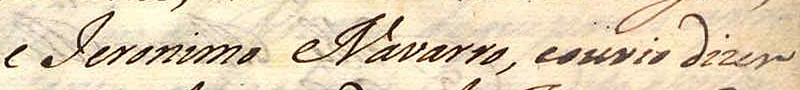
e Ieronimo Navarro, e ouvio dizer
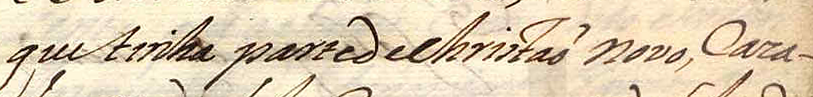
que tinha parte de christaõ novo, Caza
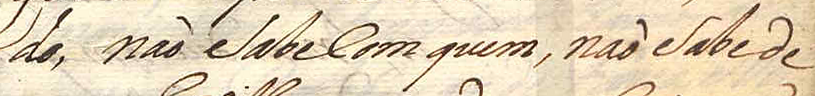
do, não sabe com quem, não sabe de
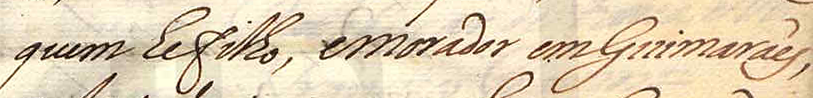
quem he filho, e morador em Guimarães,
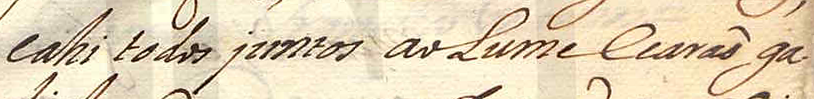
e ahi todos juntos ao Lume Cearaõ, ga
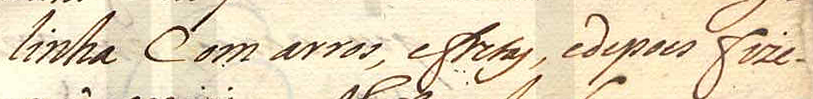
linha Com arros, e frutas, e depois fize
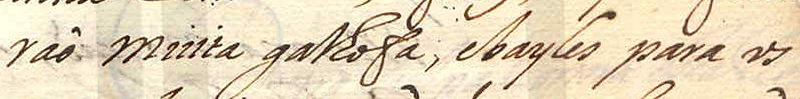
raõ muita galhofa, e bayles para os
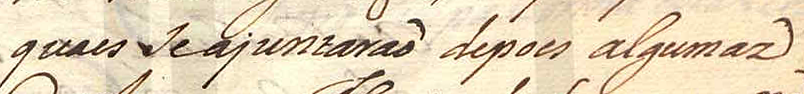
quaes se ajuntaraõ depoes algumaz
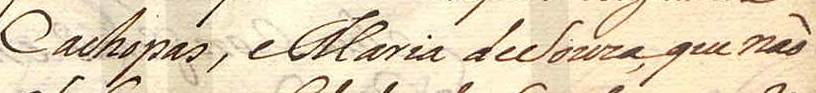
Cachopas, e Maria de Souza, que não
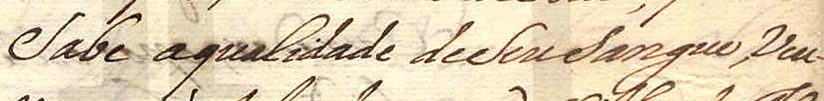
Sabe a qualidade de seu Sangue, Veu
